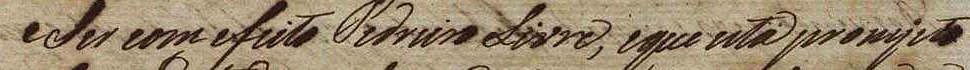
e Ser com efeito Pedreiro Livre, e que esta prompto
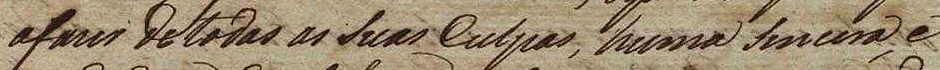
a fazer de todas as Suas Culpas, huma sincera, e
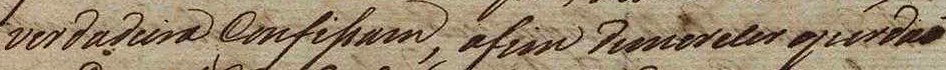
verdadeira confissam, afim de merecer o perdaõ
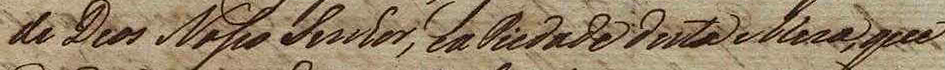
de Deos Nosso Senhor, e a Piedade desta Meza, que
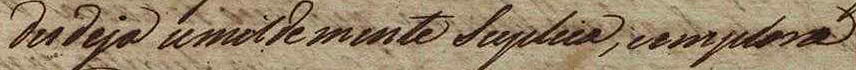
desde ja umildemente Suplica, e emplora.
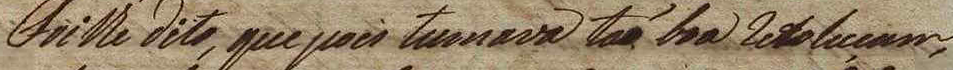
Foilhe dito, que pois tomava taõ boa Rezoluçam,
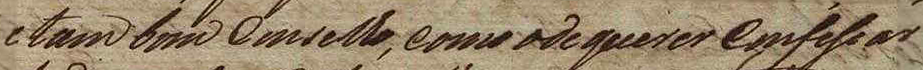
e tam bom conselho, como o de querer confessar
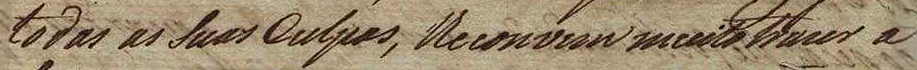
todas as Suas Culpas, lhe convem muito trazer a
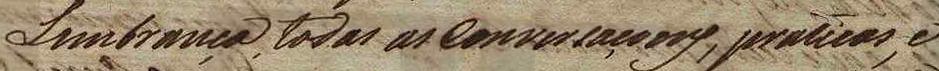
Lembrança, todas as conversaçoens, praticas, e
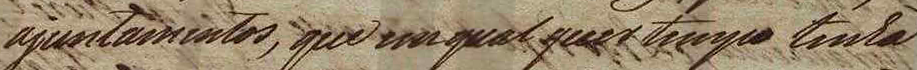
ajuntamentos, que em qualquer tempo tenha
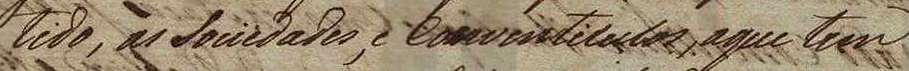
tido, as Sociedades, e ConventiCulos, a que tem
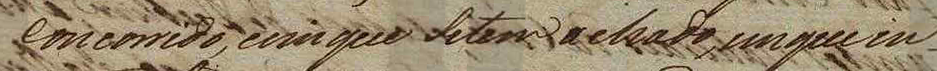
concorrido, e em que se tem achado, em que in
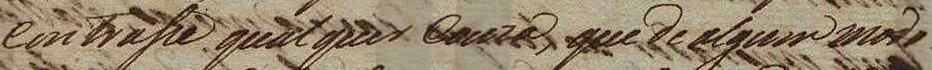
contrasse qualquer couza, que de algum modo
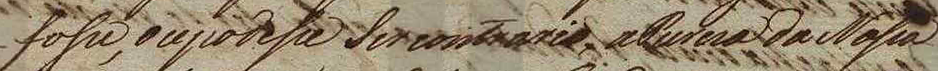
fosse, ou podesse Ser contrario, a Pureza da Nossa
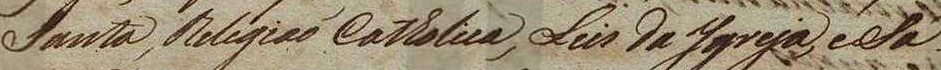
Santa Religiaõ Catholica, Leis da Jgreja, e Sa
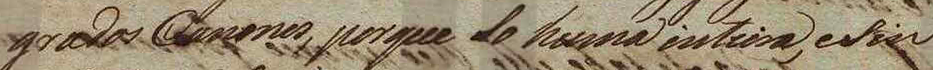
grados Canones, porque so huma inteira, e sin
